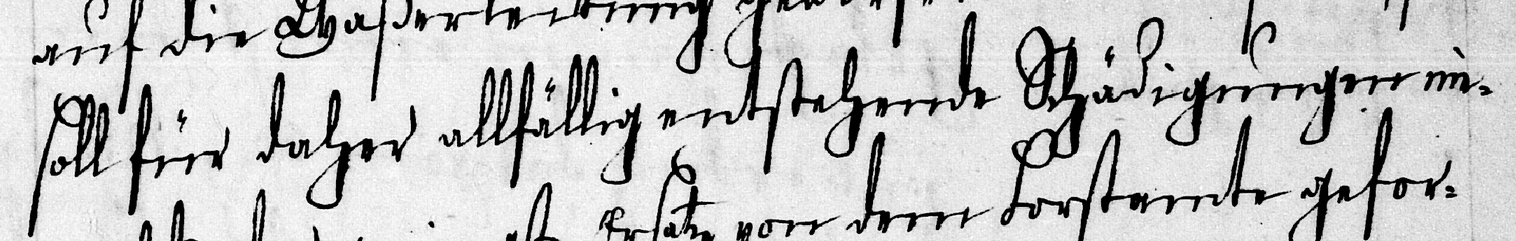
soll für daher allfällig entstehende Schädigungen nie¬
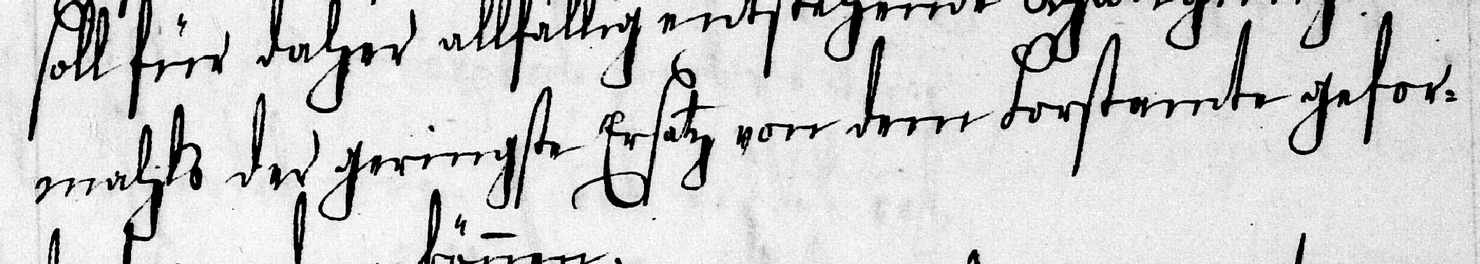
mahls der geringste Ersatz von dem Forstamte gefor¬
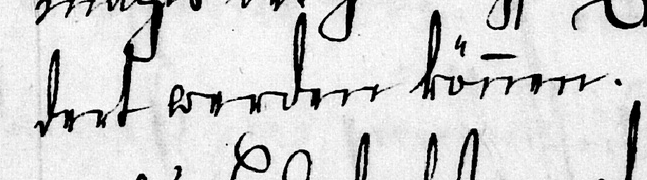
dert werden können.
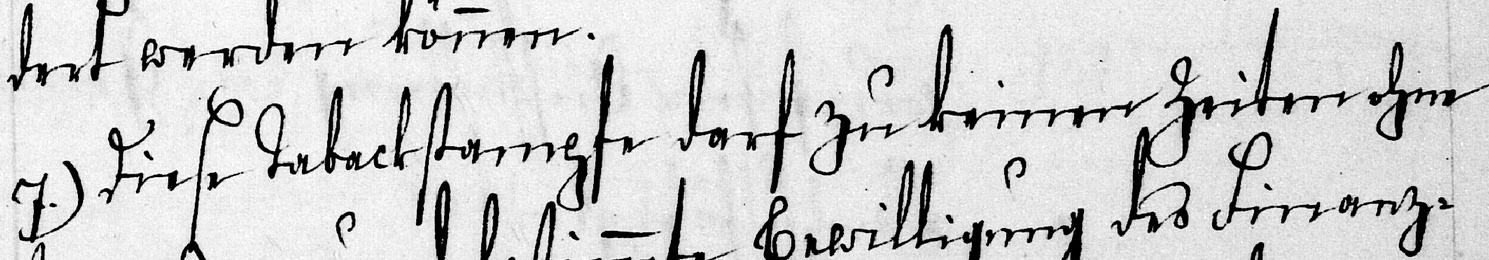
7.) Diese Tabackstampfe darf zu keinen Zeiten ohne
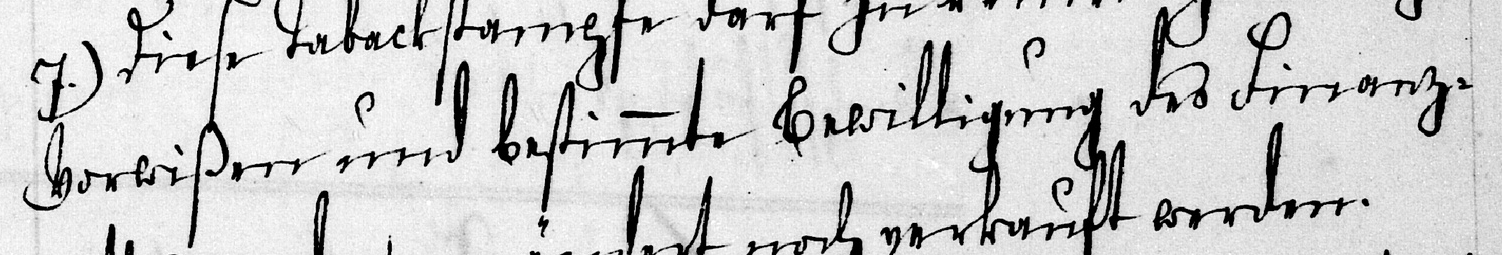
Vorwißen und bestimmte Bewilligung des Finanz¬
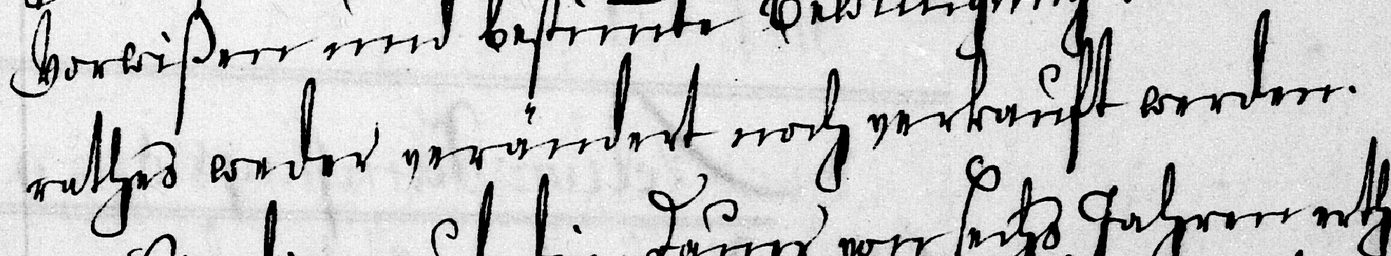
rathes weder verändert noch verkauft werden.
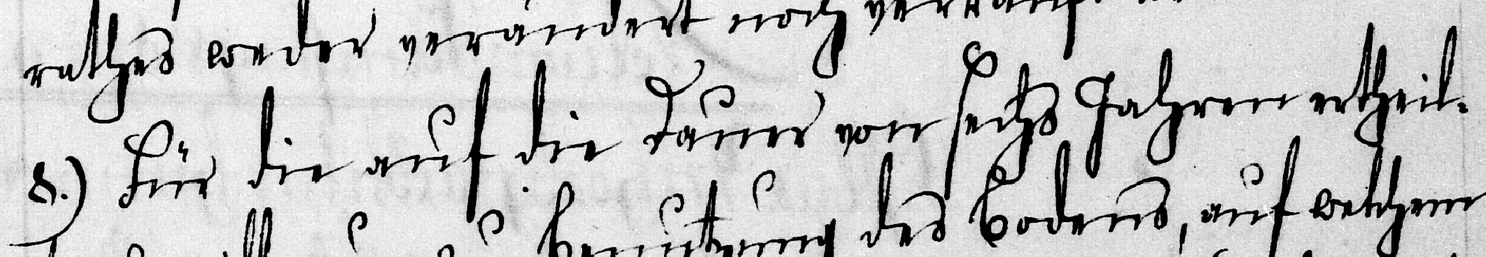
8.) Für die auf die Dauer von sechs Jahren ertheil¬
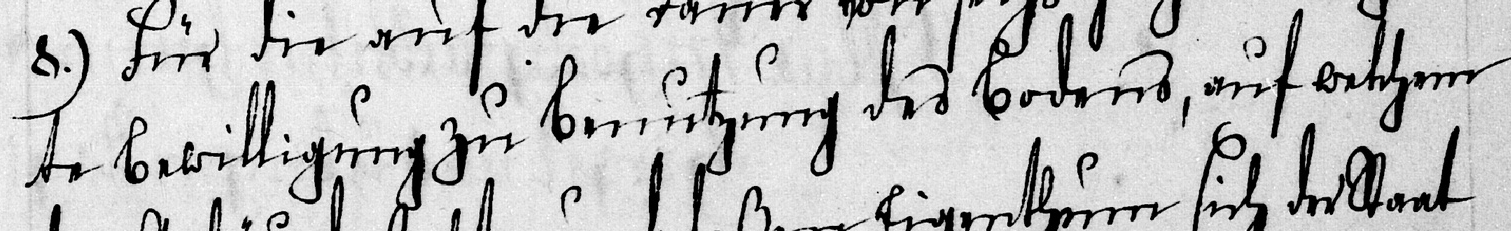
te Bewilligung zu Benutzung des Bodens, auf welchem
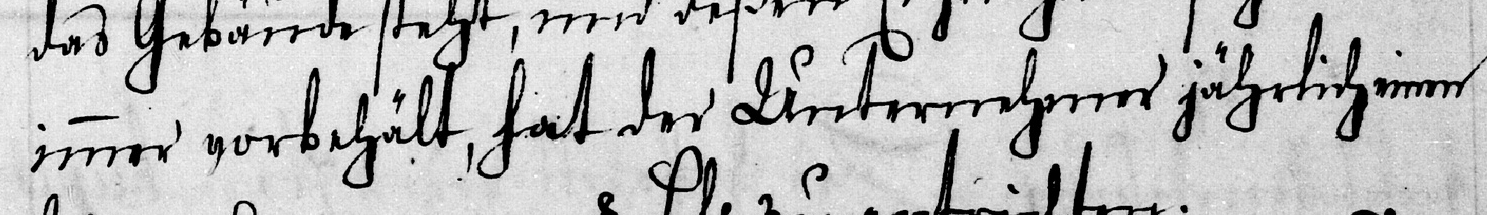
immer vorbehält, hat der Unternehmer jährlich einen
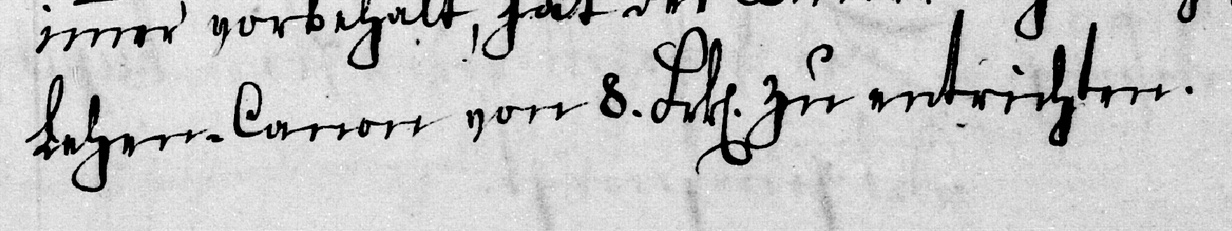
Lehen-Canon von 8. Frk[en]. zu entrichten.
